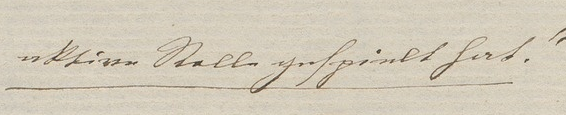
aktive Rolle gespielt hat.»
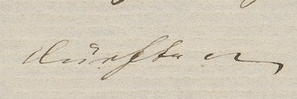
dürfte. –
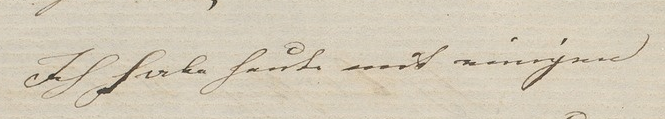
Ich habe heute aus einigen
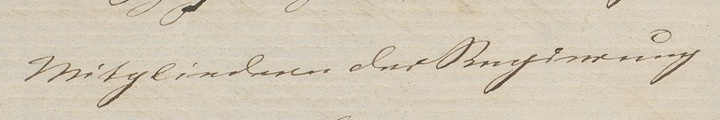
Mitgliedern der Regierung
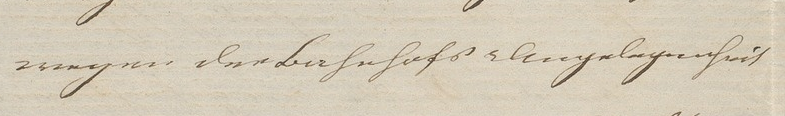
wegen der Bahnhofs-Angelegenheit
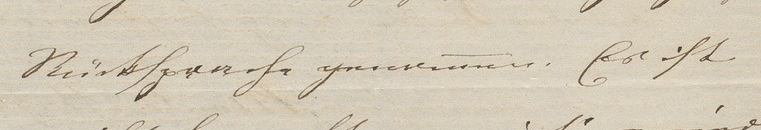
Rücksprache genommen. Es ist
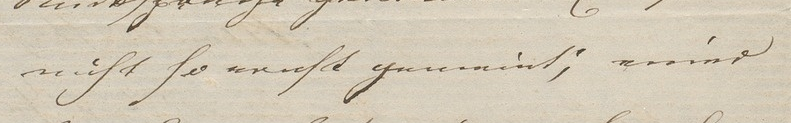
nicht so ernst gemeint; einer
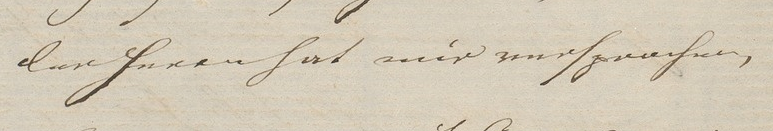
der Herrn hat mir versprochen,
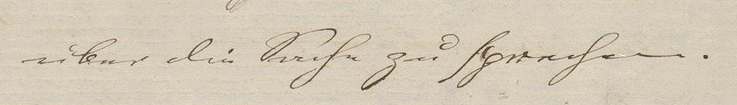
über die Sache zu sprechen.
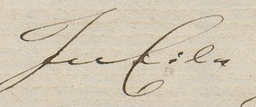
In Eile
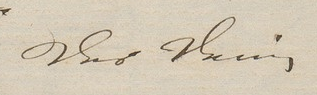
Der Deine
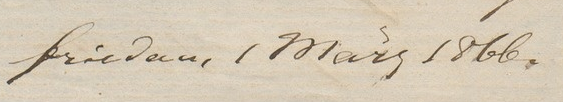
Friedau,1 März 1866.
